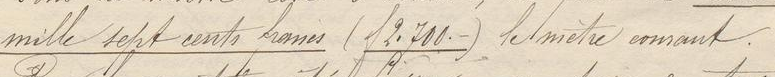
mille sept cents francs (f 2.700.–) le mètre courant.
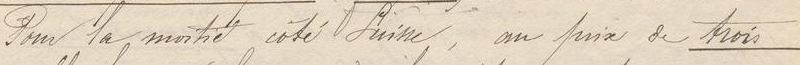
Pour la moitié côté Suisse, au prix de Trois
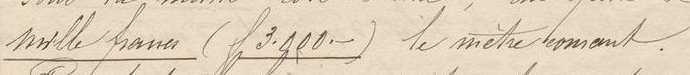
mille francs (f 3.000.–) le mètre courant.
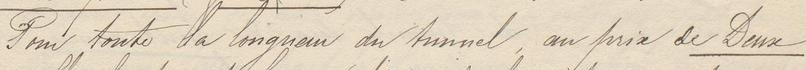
Pour toute la longueur du tunnel, au prix de Deux
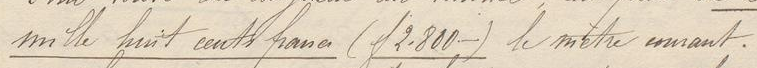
mille huit cents francs (f 2.800.–) le mètre courant.
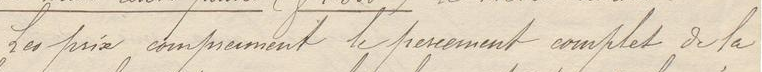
Les prix comprennent le percement complet de la
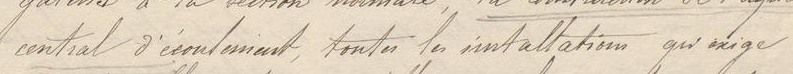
central d'écoulement , toutes les installations qu'exige
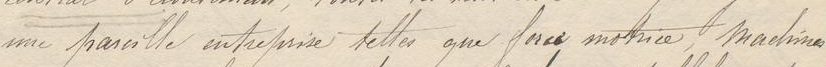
une pareille entreprise telles que force motrice, machines
